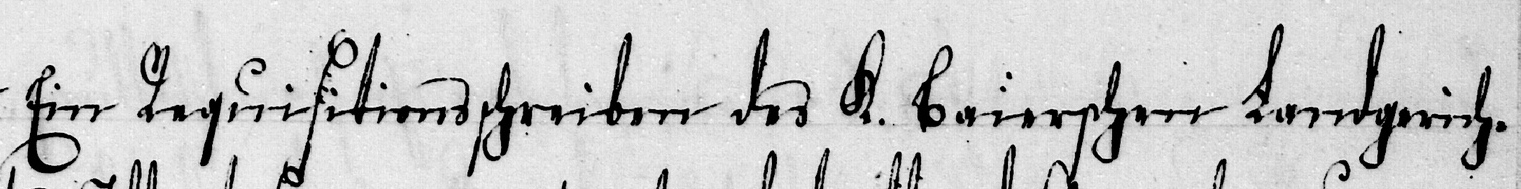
Ein Requisitionsschreiben des K. Baierschen Landgerich¬
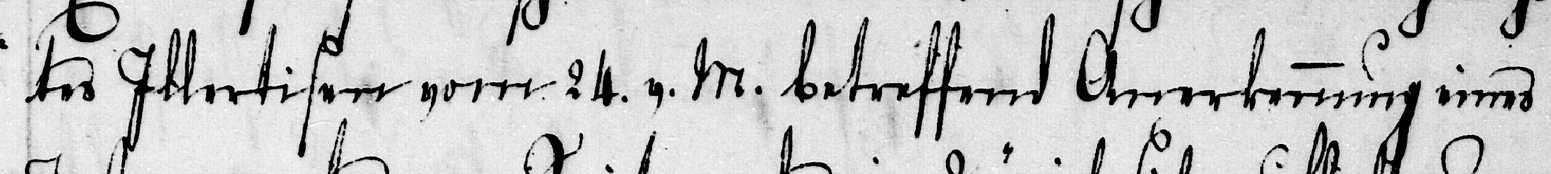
tes Illertisen vom 24. v. M. betreffend Anerkennung eines
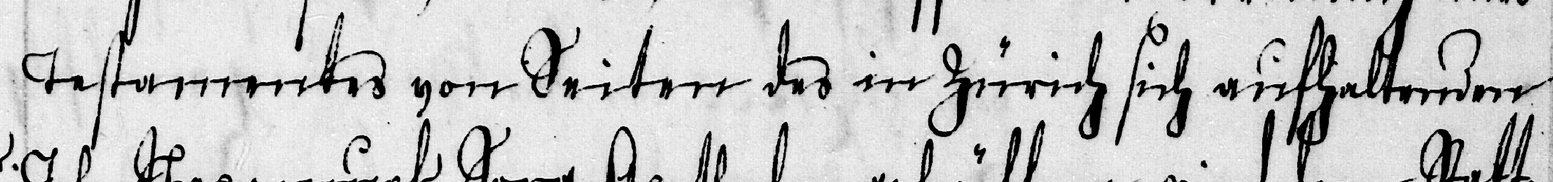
Testamentes von Seiten des in Zürich sich aufhaltenden
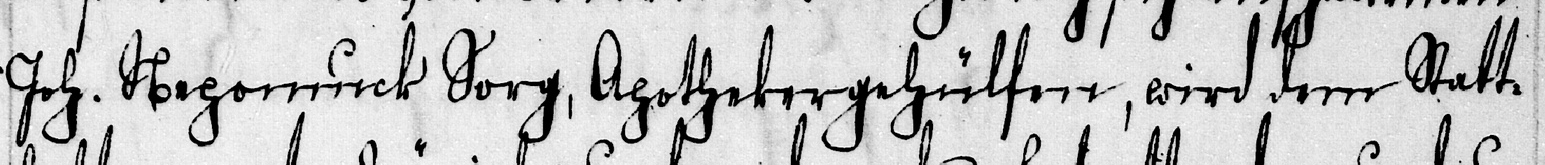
Joh. Nepomuck Sorg, Apothekergehülfen, wird dem Statt¬
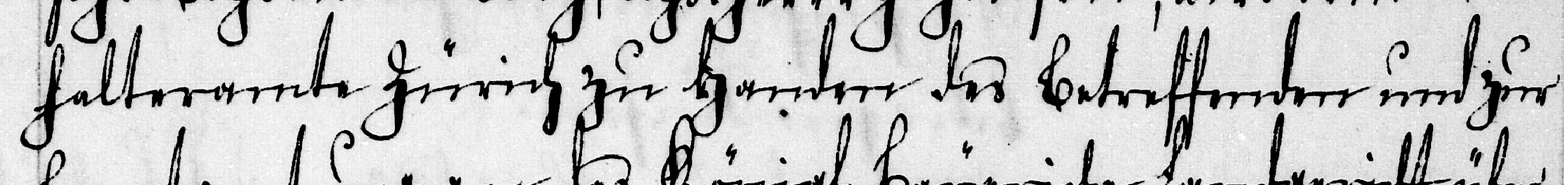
halteramte Zürich zu Handen des Betreffenden und zur
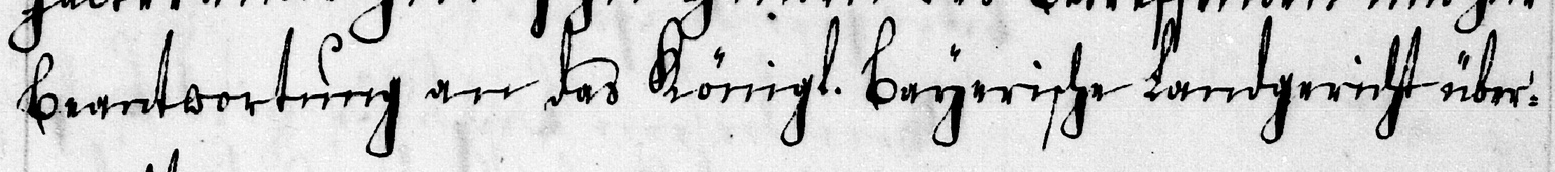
Beantwortung an das Königl. Bayerische Landgericht über¬
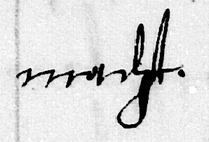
macht.
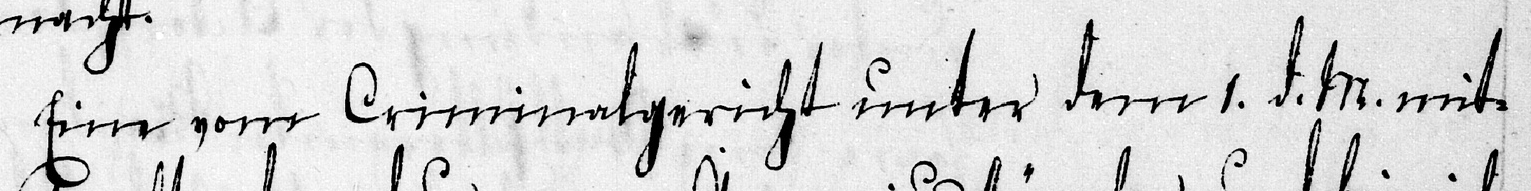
Eine vom Criminalgericht unter dem 1. d. M. mit¬
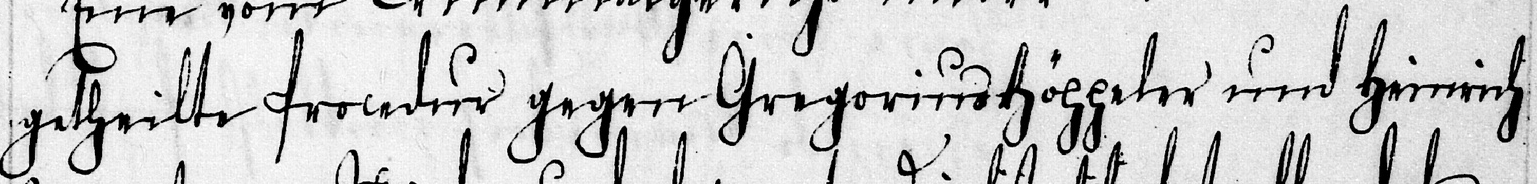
getheilte Procedur gegen Gregorius Höppeler und Heinrich
